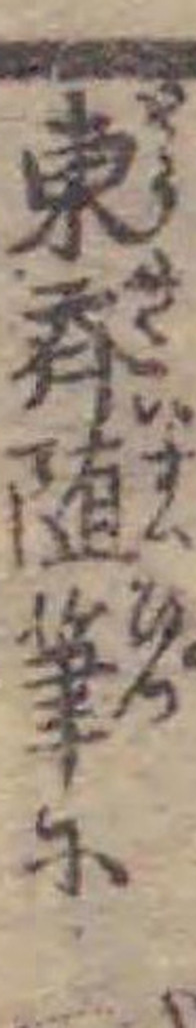東斉随筆に
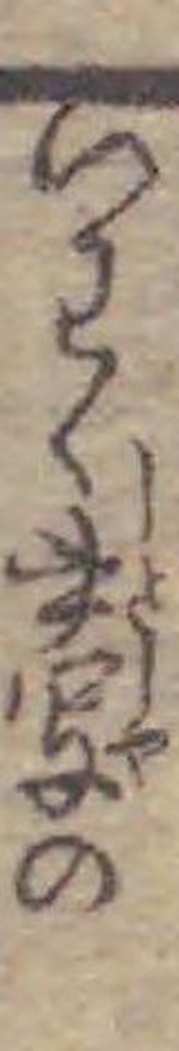いわく書写の
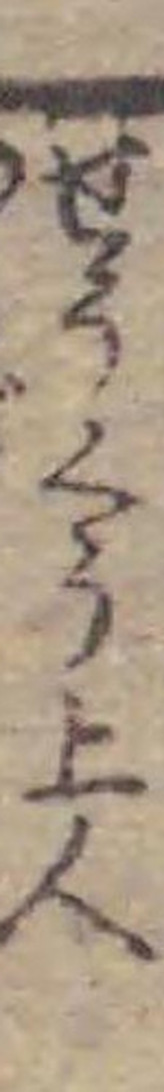せうくう上人
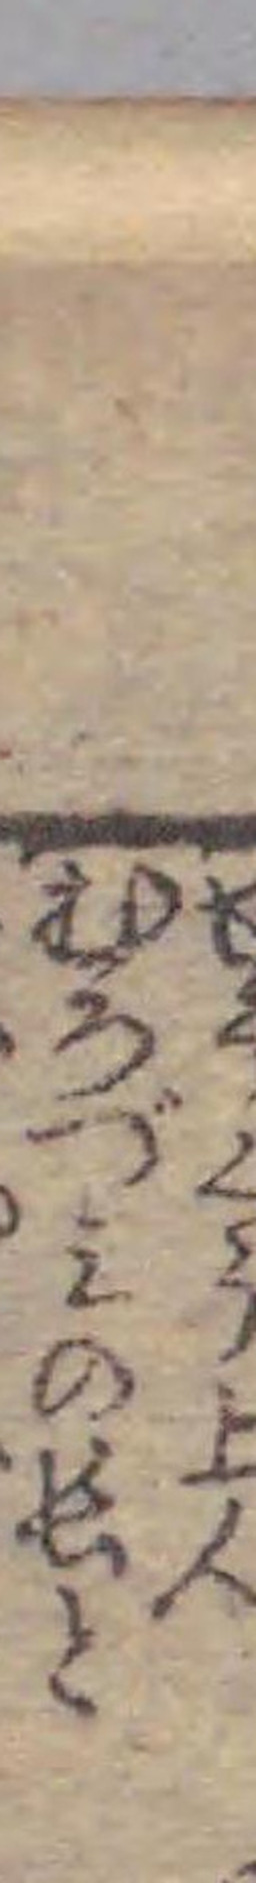むろづみの長と
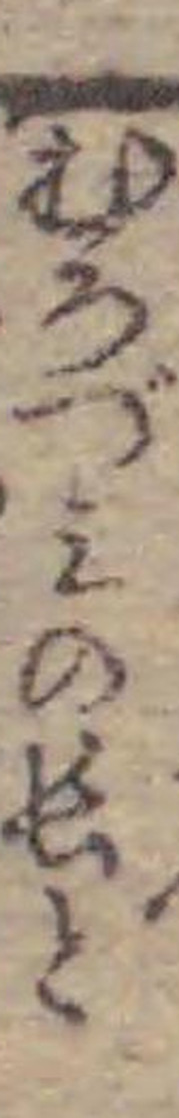むろづみの長と
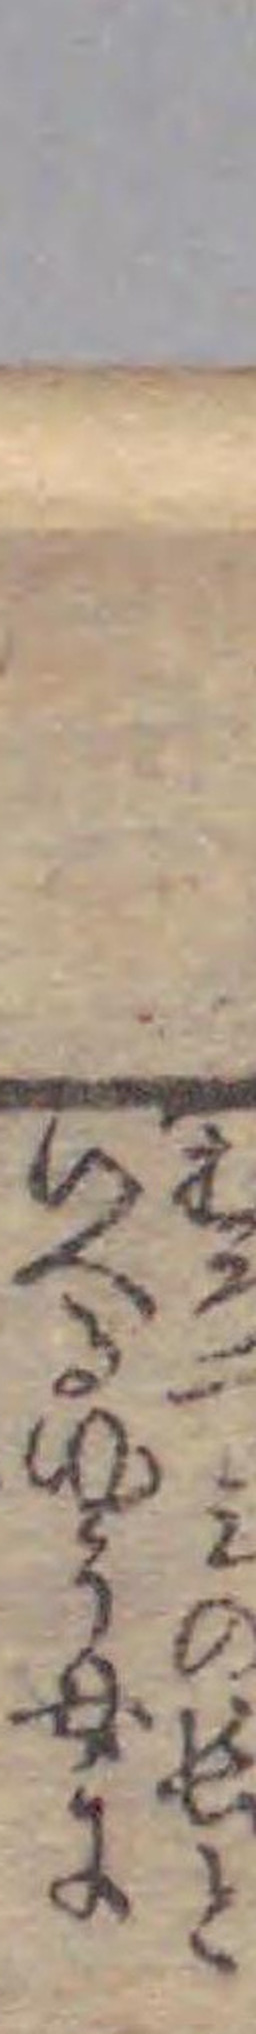いへるゆう女に
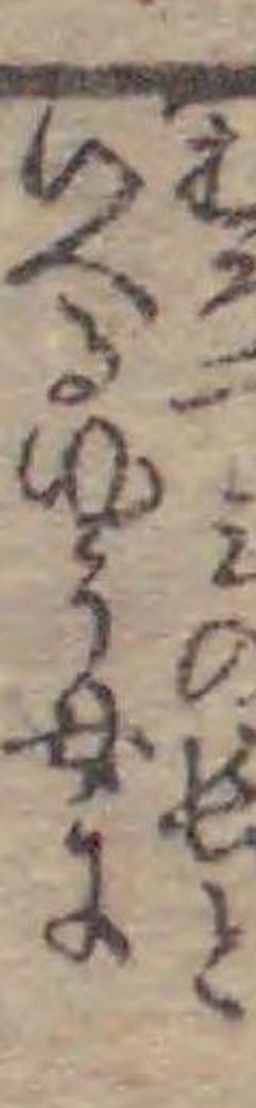いへるゆう女に
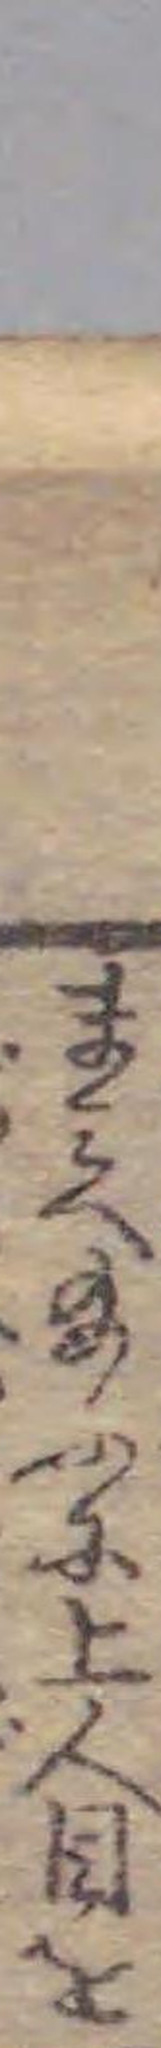まみへ給ふに上人目を
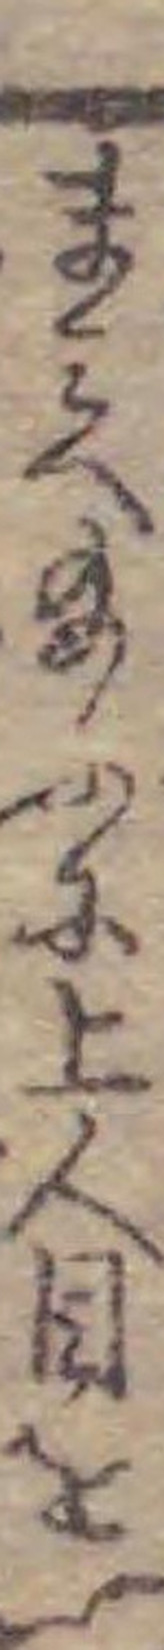まみへ給ふに上人目を
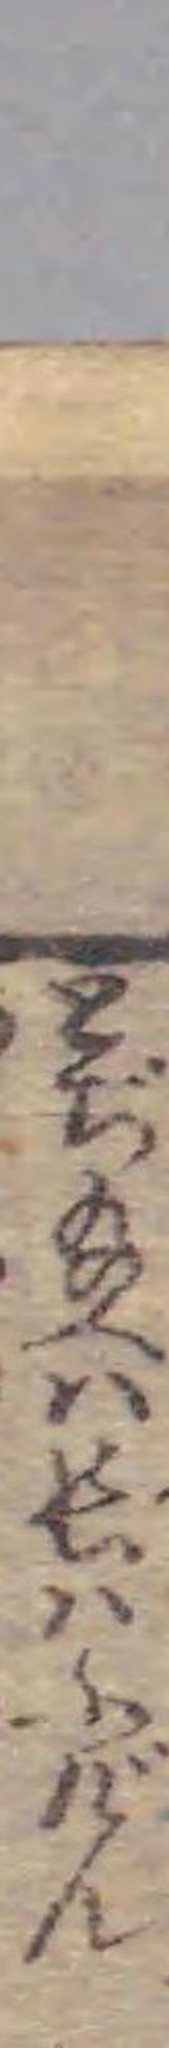とぢ給へは長はふげん
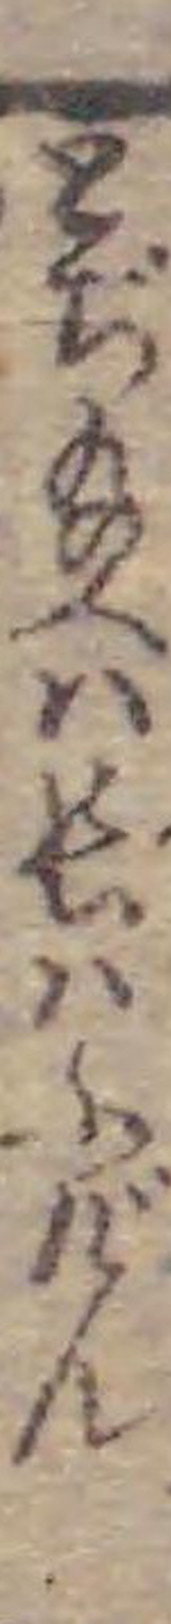とぢ給へは長はふげん
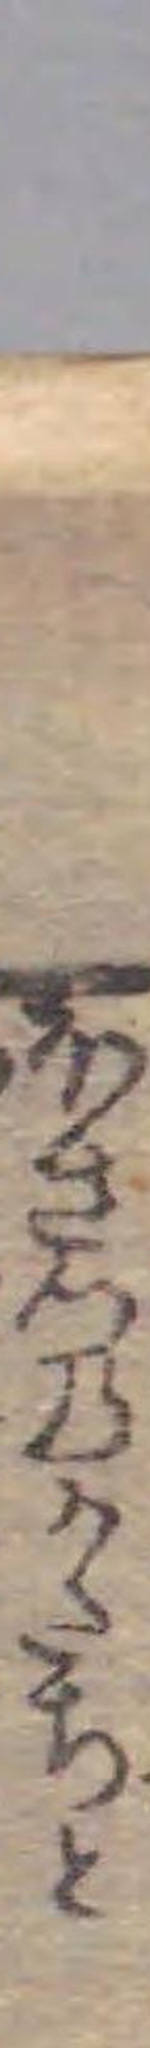ほさつのかたちと
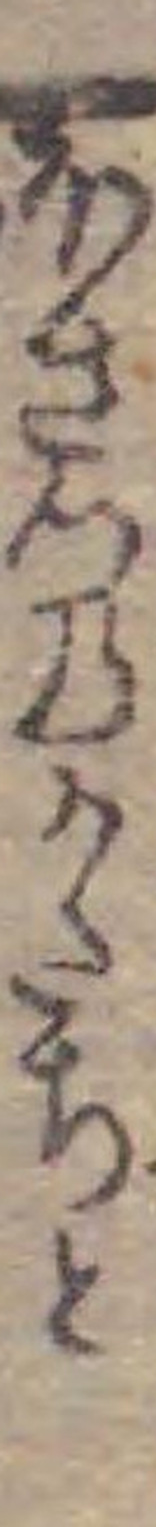ほさつのかたちと
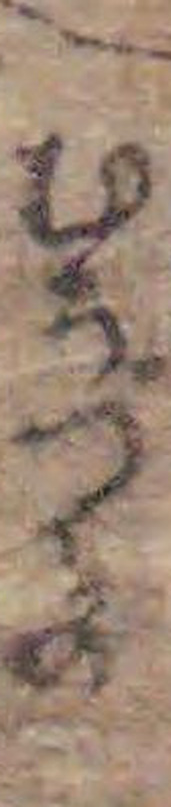むろづみの
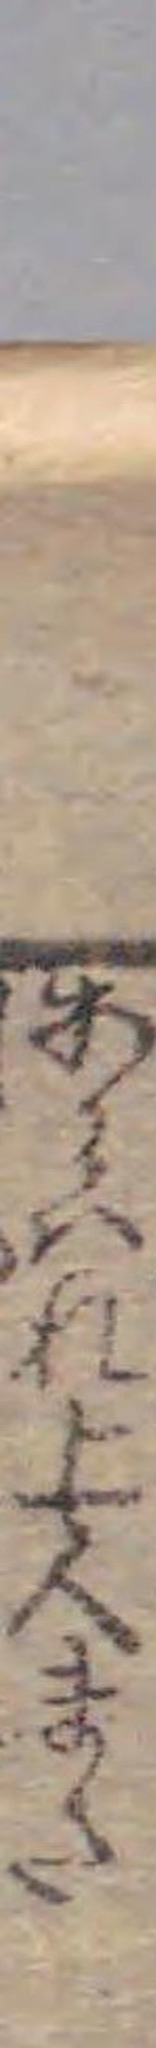あらはれ上人また
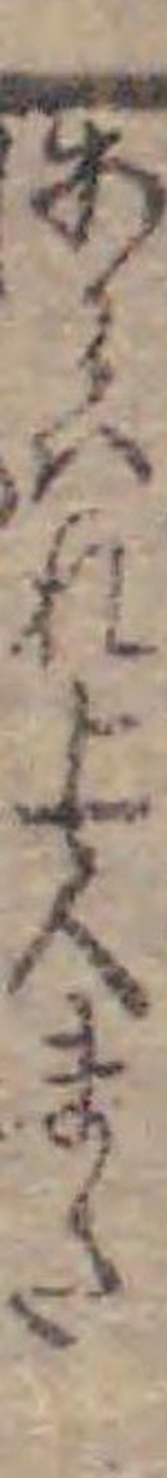あらはれ上人また
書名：北国順礼唄方便 : 3巻
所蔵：国立国会図書館 National Diet Library, JAPAN
